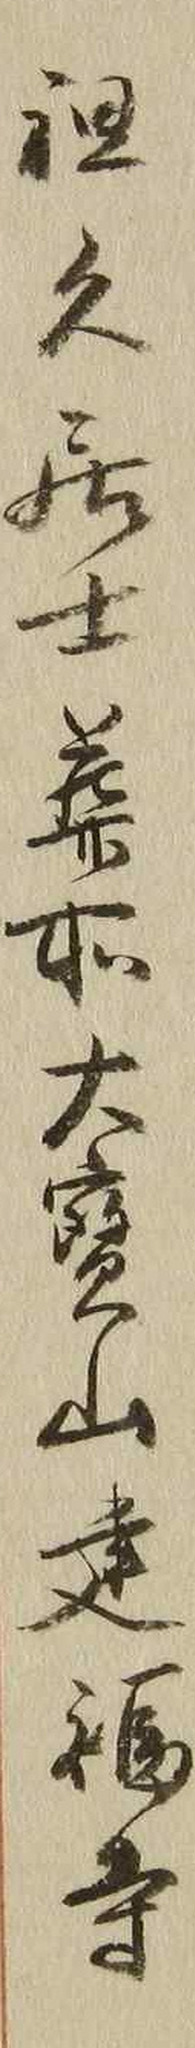祖久居士葬所大宝山建福寺
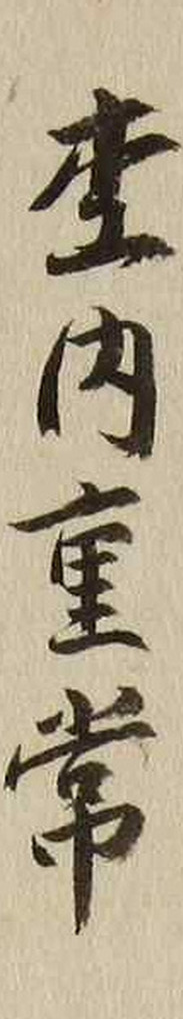杢内重常
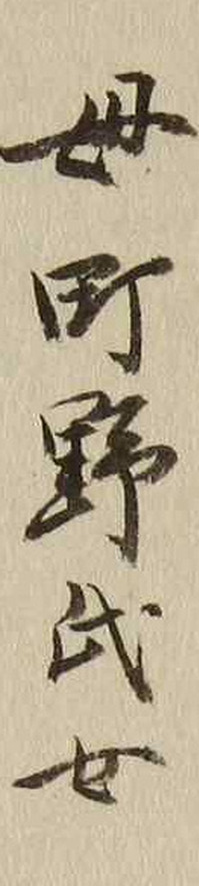母町野氏女
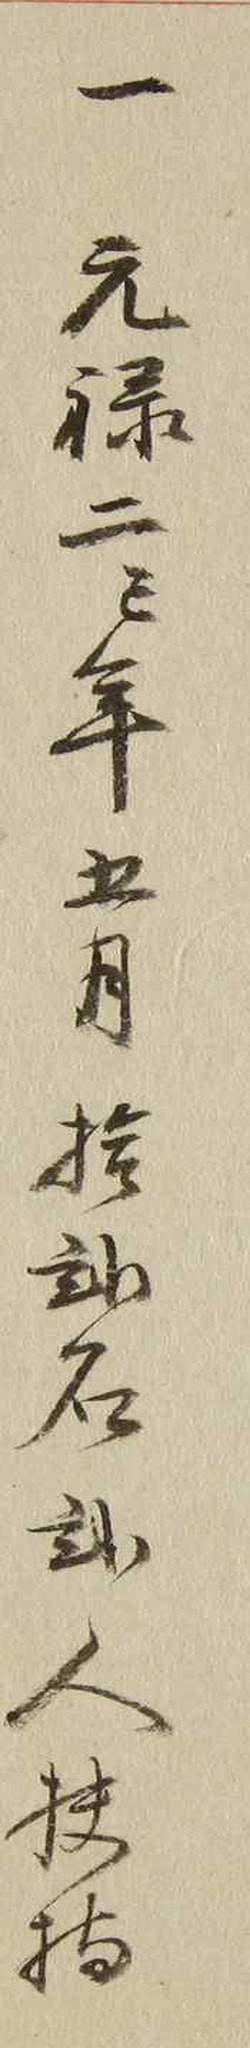一元禄二巳年五月拾弐石弐人扶持
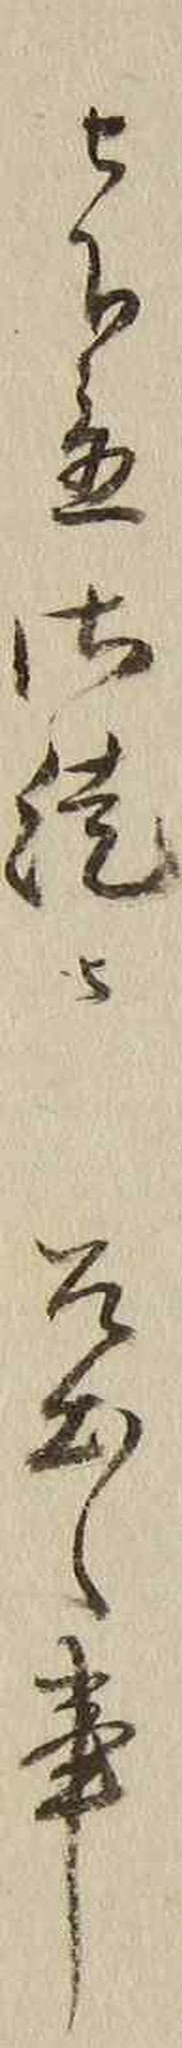被下置御徒被召出候事
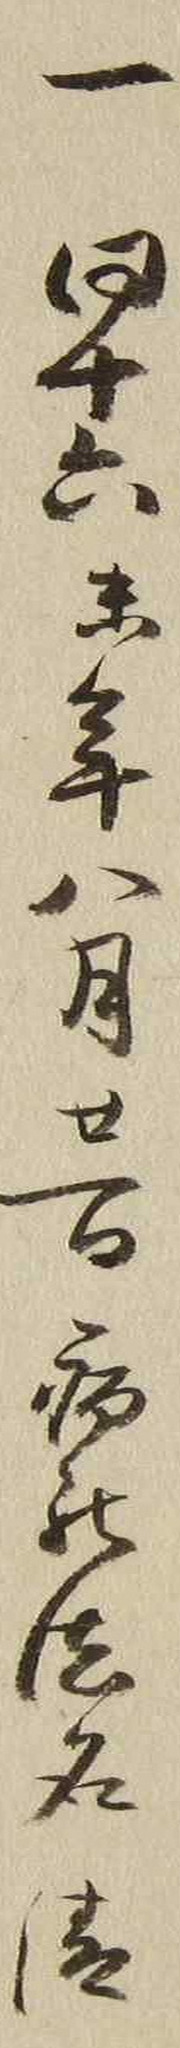一同十六未年八月廿一日病死法名清
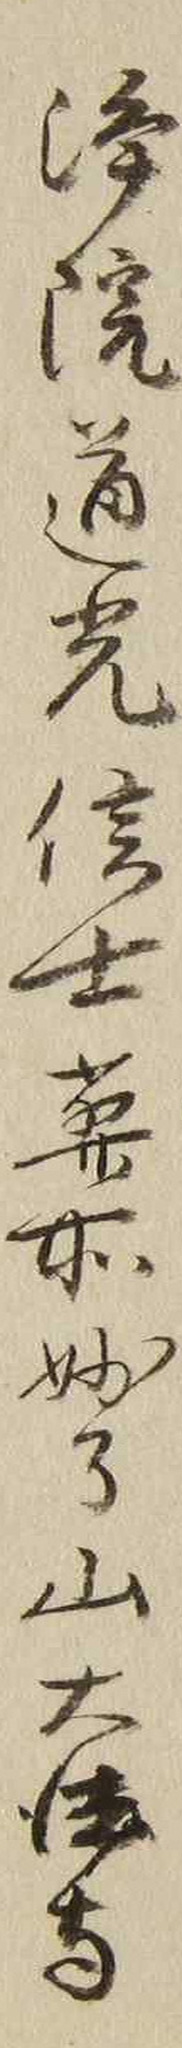浄院道光信士葬所妙了山大法寺
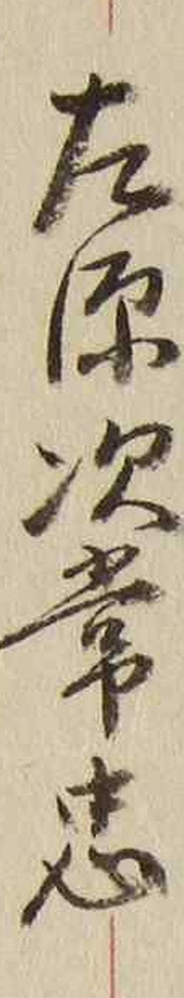左源次常忠

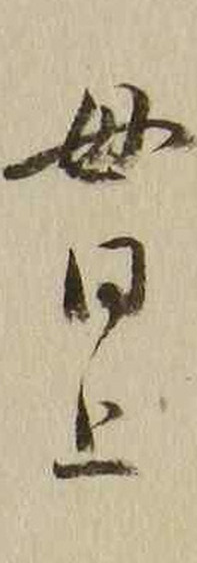母同上
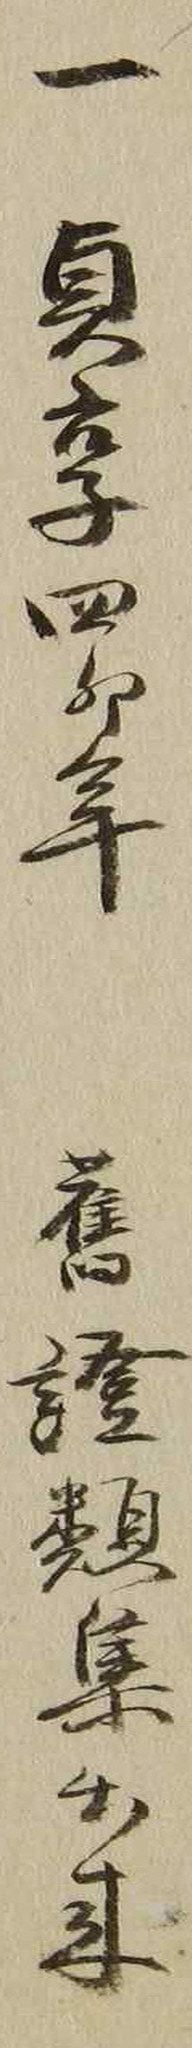一貞享四卯年旧証類集出来
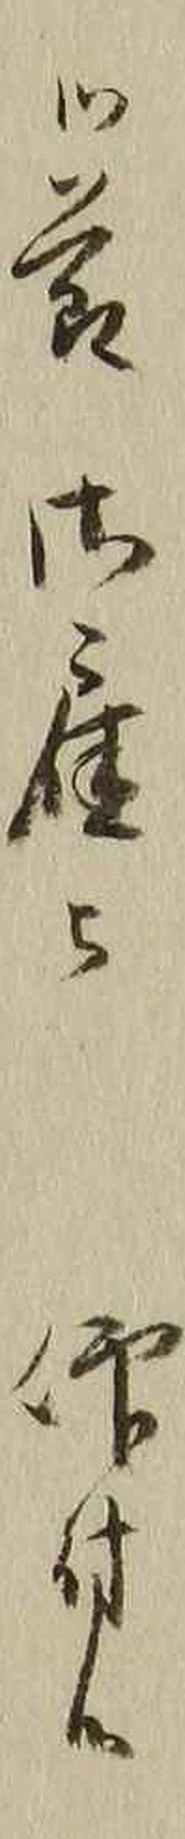候節御雇被仰付候
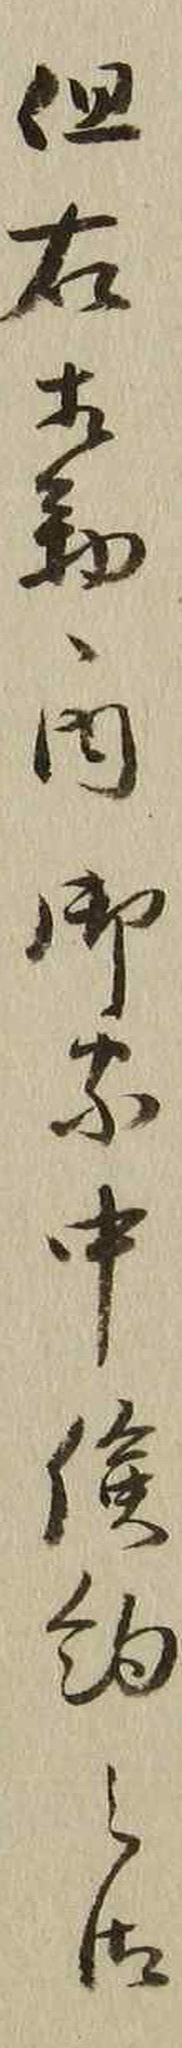但右相勤候内御家中倹約之御
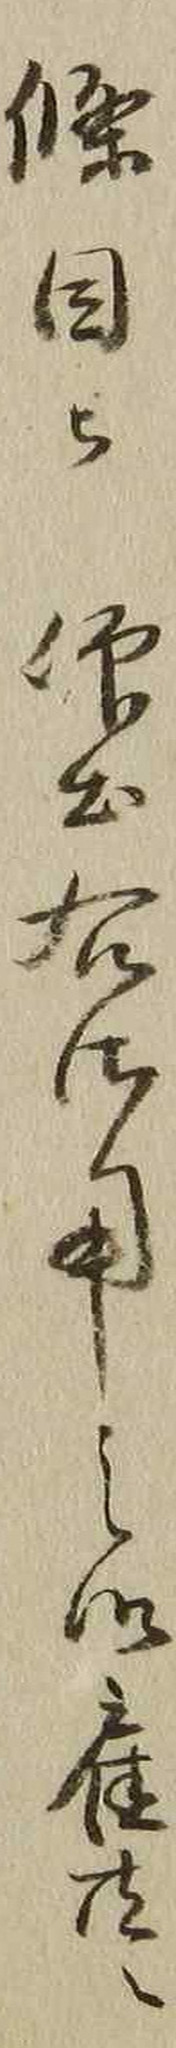条目被仰出右御用之御雇共々
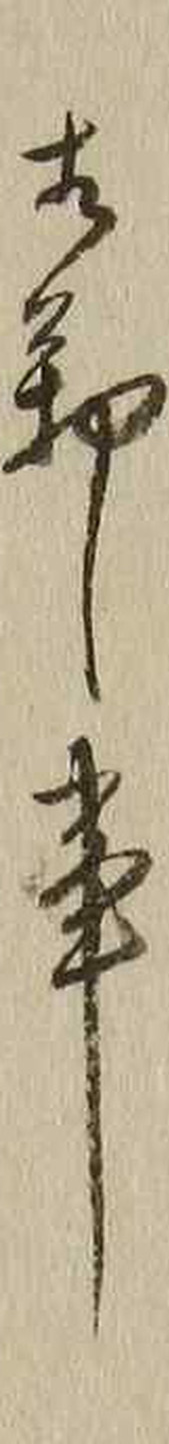相勤候事
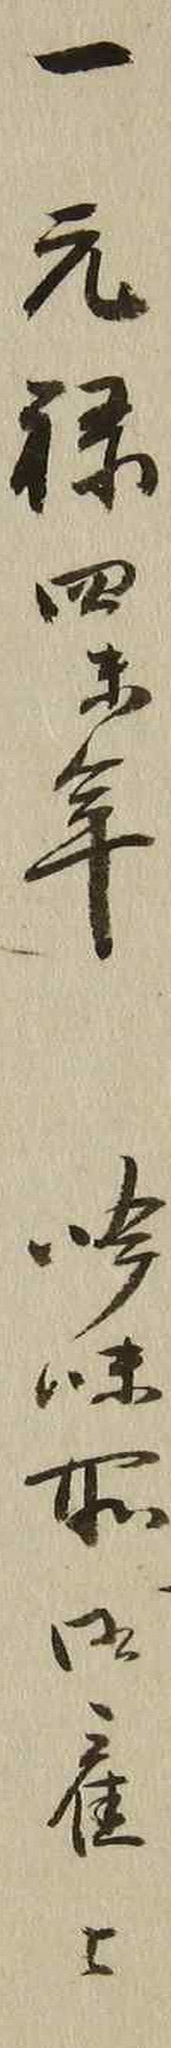一元禄四未年吟味所御雇被
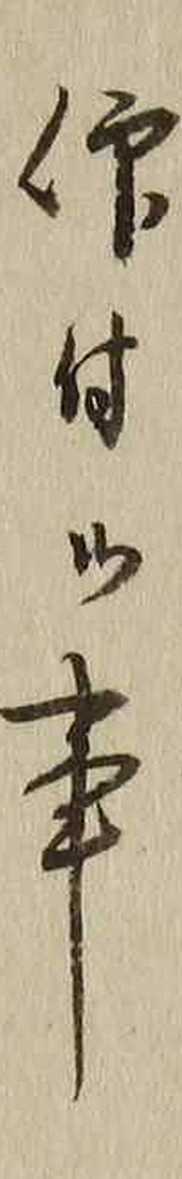仰付候事
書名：諸士系譜　巻之236　ふ之部4
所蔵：会津若松市立会津図書館
